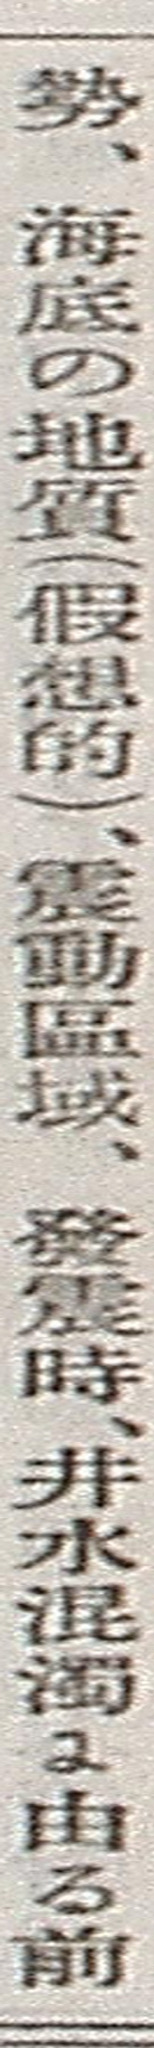勢、海底の地質、震動区域、発震時、井水混濁に由る前
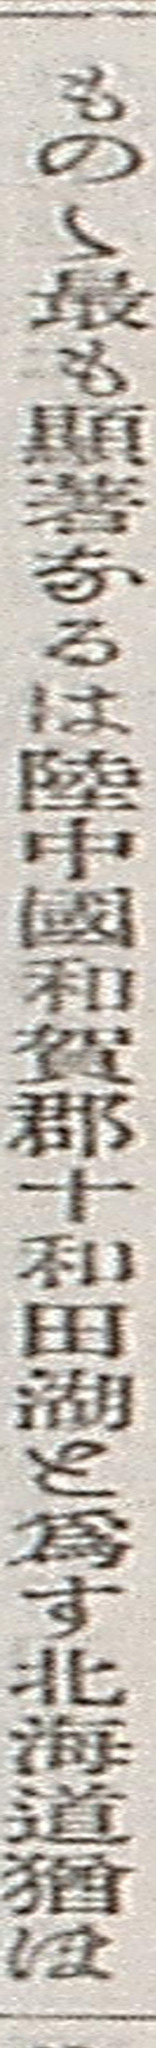ものゝ最も顕著なるは陸中国和賀郡十和田湖と為す北海道猶ほ
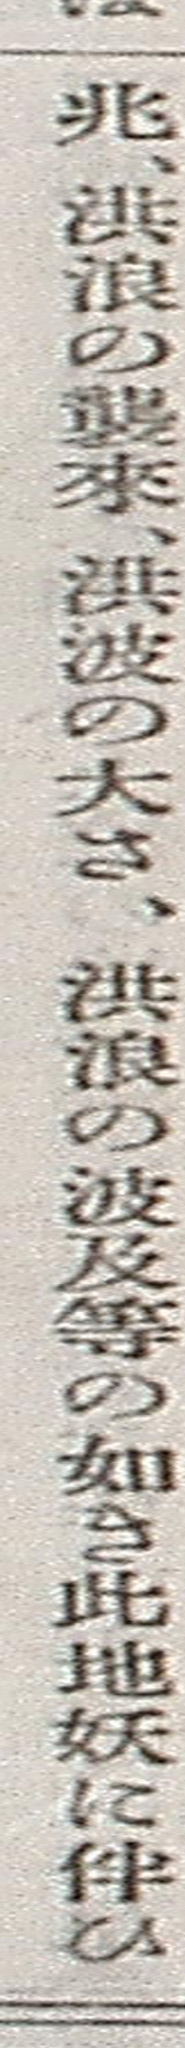兆、洪浪の襲来、洪波の大さ、洪浪の波及等の如き此地妖に伴ひ
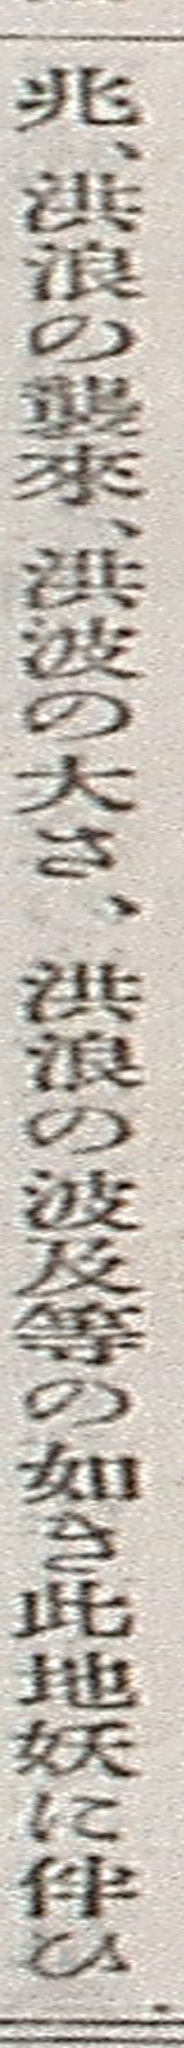兆、洪浪の襲来、洪波の大さ、洪浪の波及等の如き此地妖に伴ひ
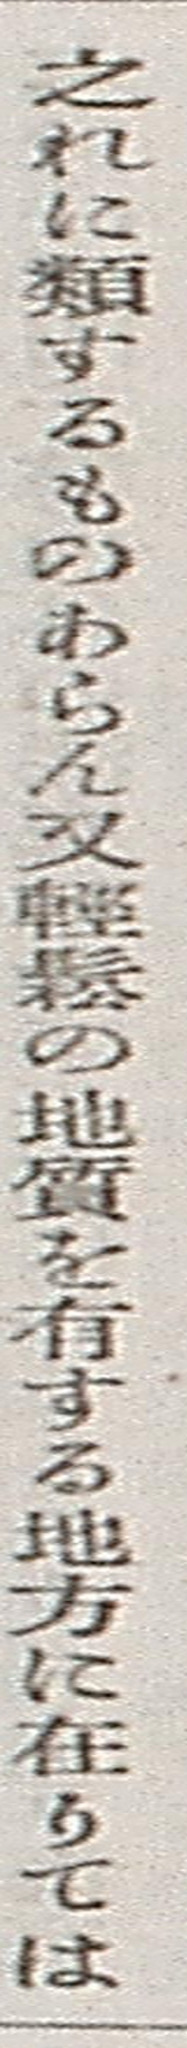之れに類するものあらん又軽鬆の地層を有する地方に在りては
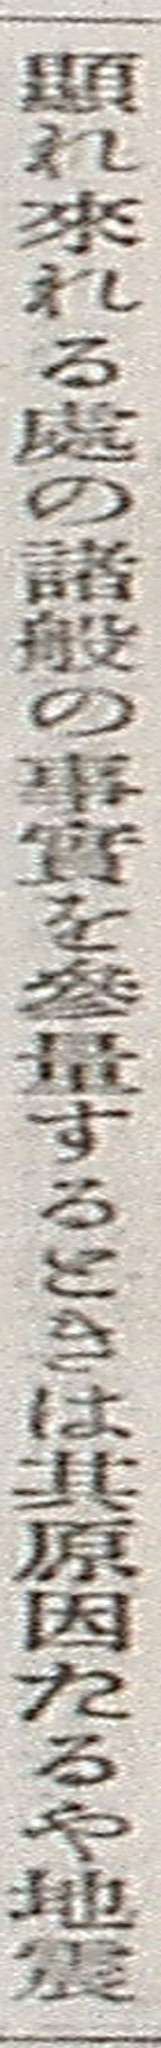顕れ来れる処の諸般の事実を参量するときは其原因たるや自地震
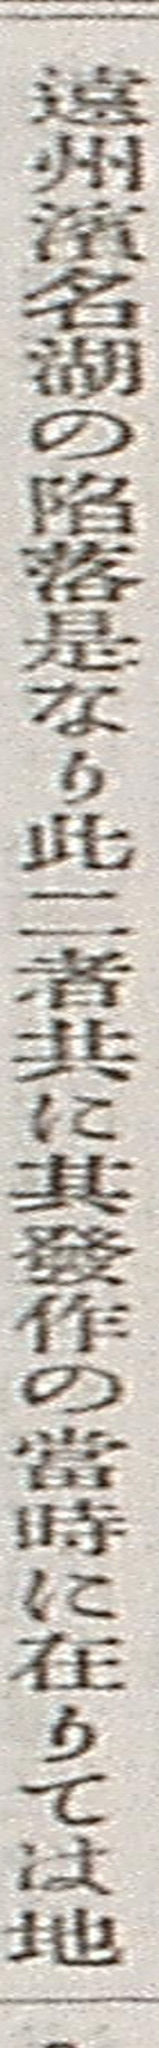遠州浜名湖の陥落是なり此二者共に其発作の当時に在りては地
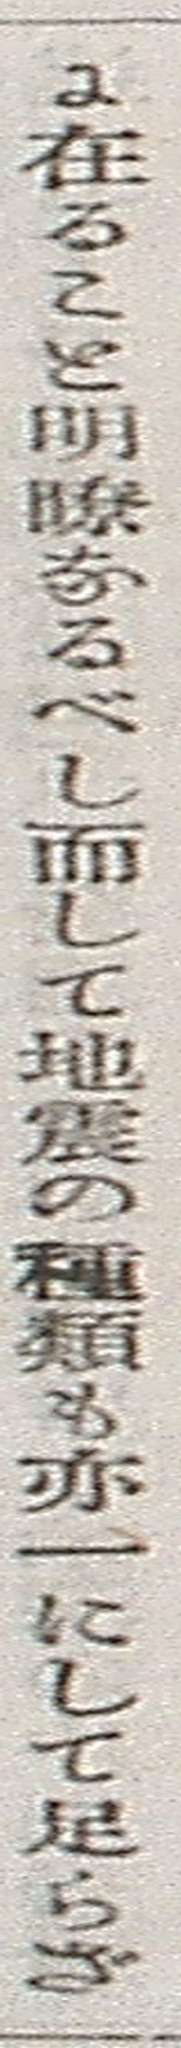に在ること明瞭なるべし而して地震の種類も亦一にして足らざ
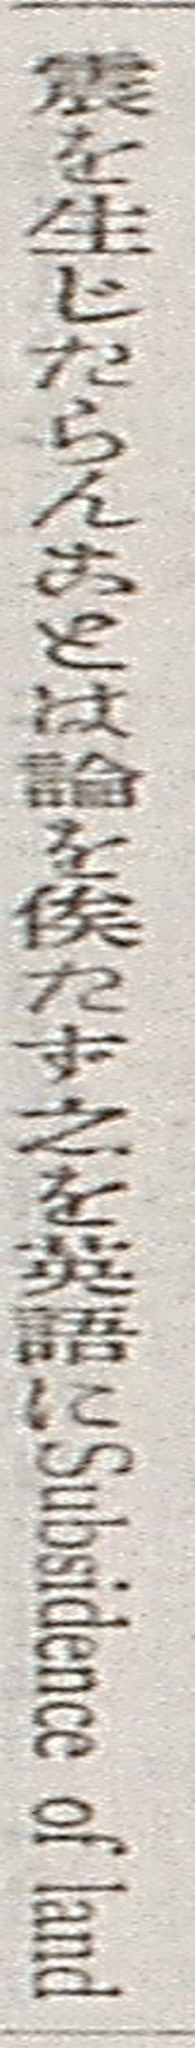震を生じたらんことは論を俟たず之を英語に
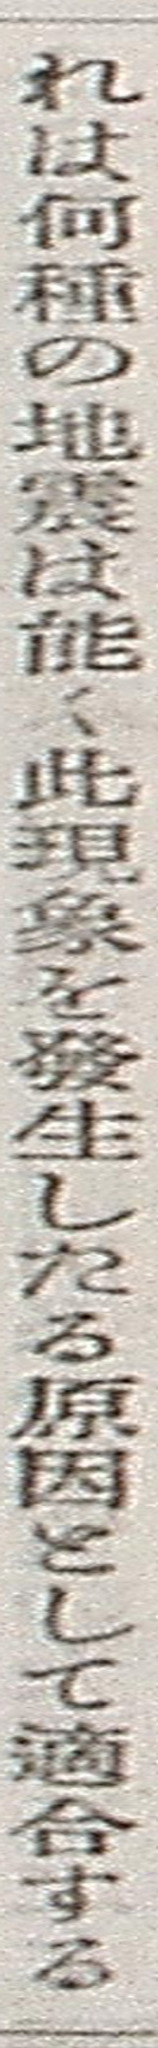れは何種の地震は能く此現象を発生したる原因として適合する
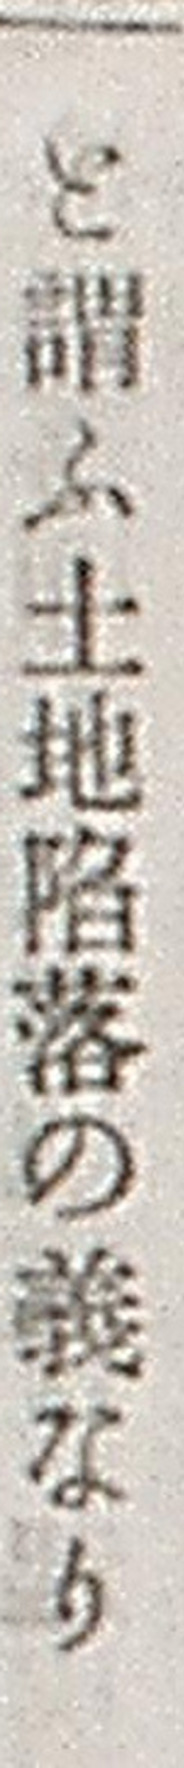と謂ふ土地陥落の義なり
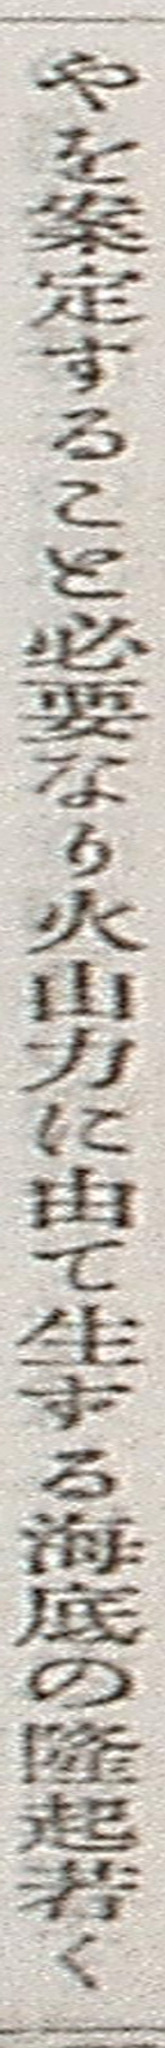やを案定すること必要なり火山力に由て生ずる海底の隆起若く

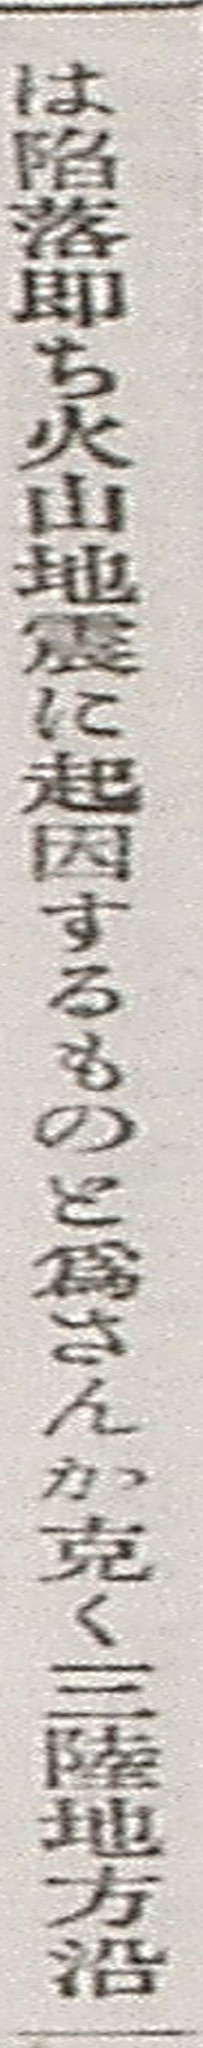は陥落即ち火山地震に起因するものと為さんか克く三陸地方沿
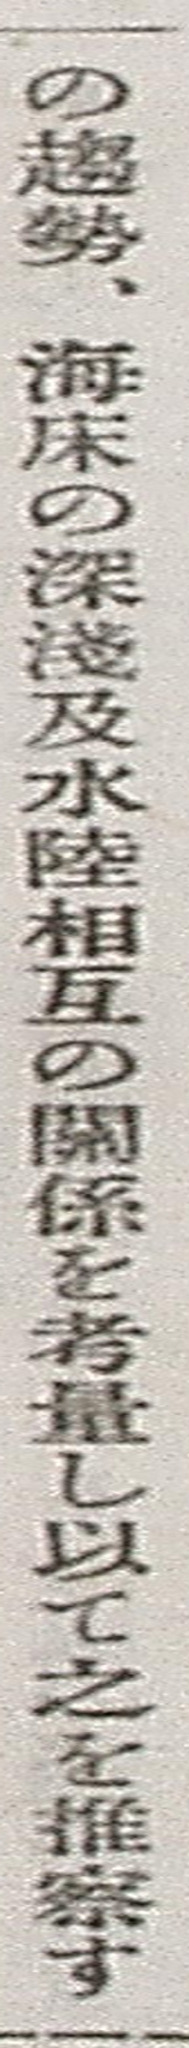の趨勢、海床の深浅及水陸相互の関係を考量し以て之を推察す
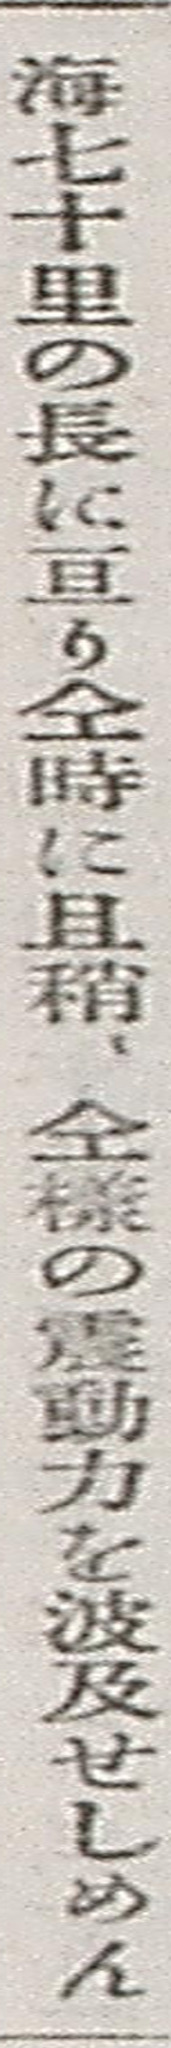海七十里の長に亘り同時に且稍、同様の震動力を波及せしめん
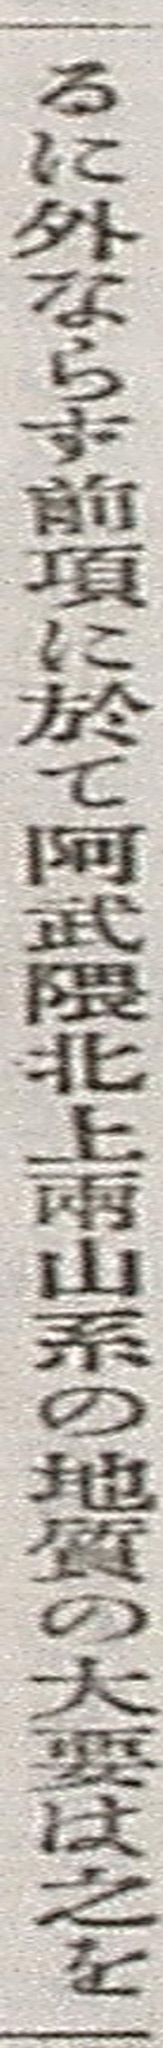るに外ならず前項に於て阿武隈北上両山系の地質の大要は之を
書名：風俗畫報臨時増刊第百二十號　大海嘯被害録（下）
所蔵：東京大学地震研究所図書室 Earthquake Research Institute Library, The University of Tokyo, JAPAN
